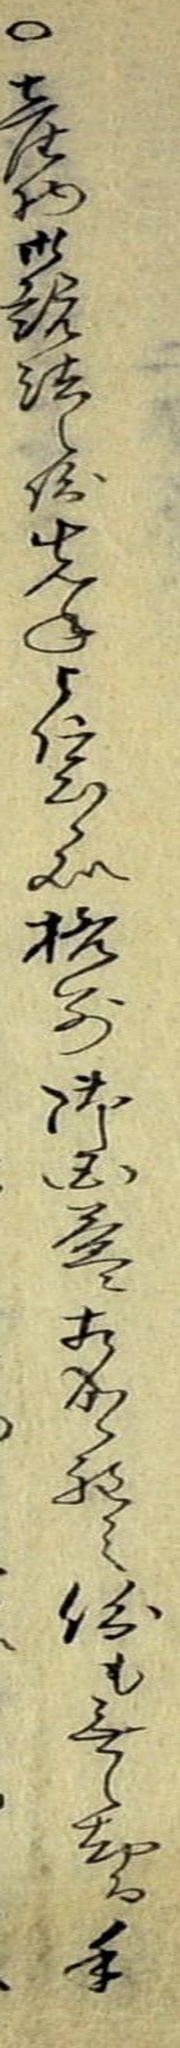○産物御趣法之儀先年被仰出候処格別御国益に相成候程之儀も無之却而手
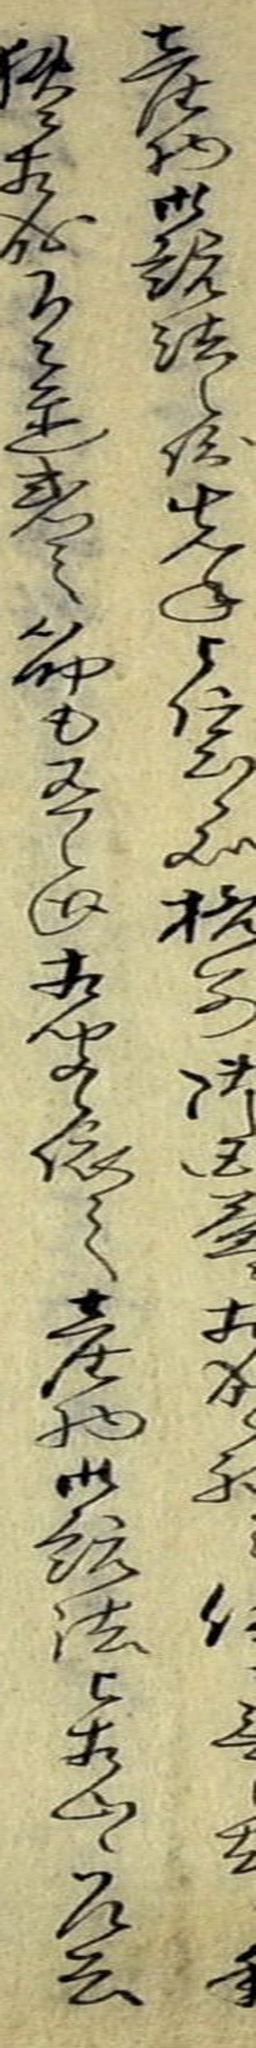狭に相成下々迷惑之筋も有之趣相聞候依之産物御趣法被相止候乍去
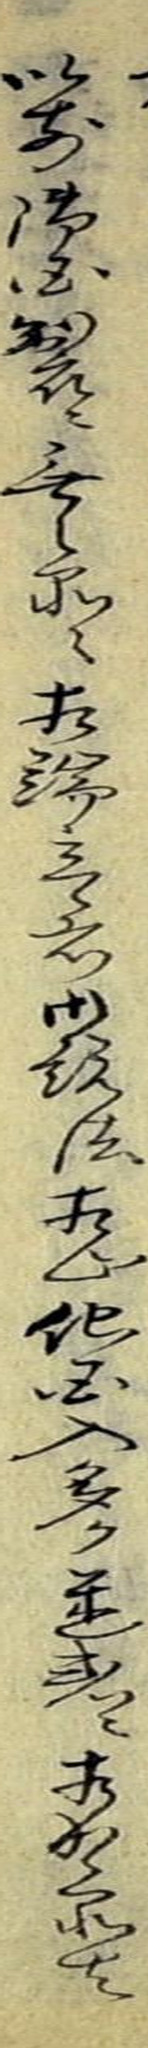以前御国製に無之品々相端立候者御趣法相止他国入多ク迷惑に相成品は
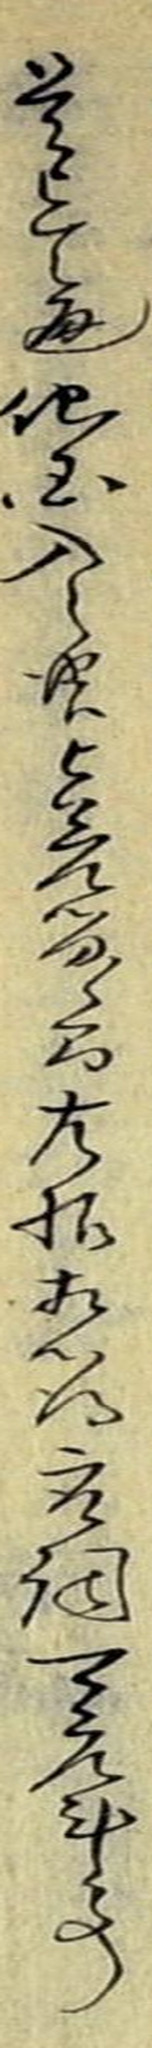是迄之通他国入候儀は被差留候間左様相心得取調可取斗事
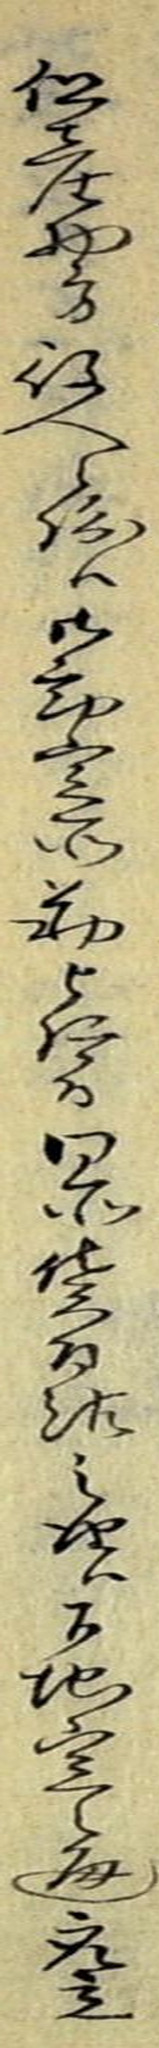但産物方役人之儀は御勘定所勤被仰付同所貸付銀之儀は下地定之通取立
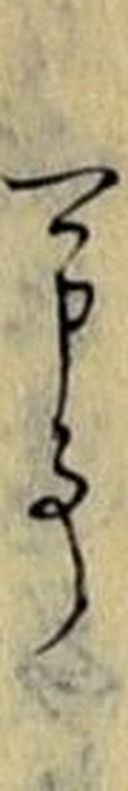可申事
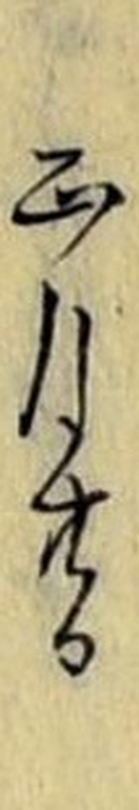正月廿日
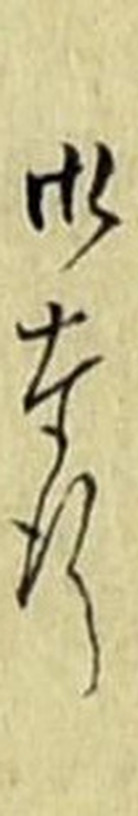御奉行
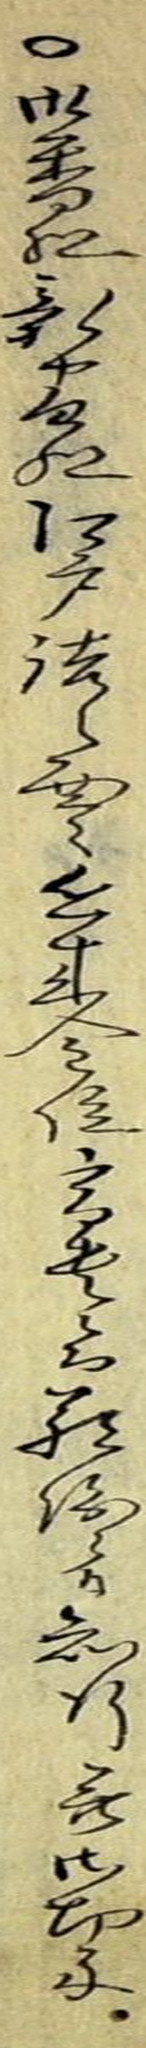○御番組新番組江戸詰之面々金位高貴に而難儀に付知行并御切米
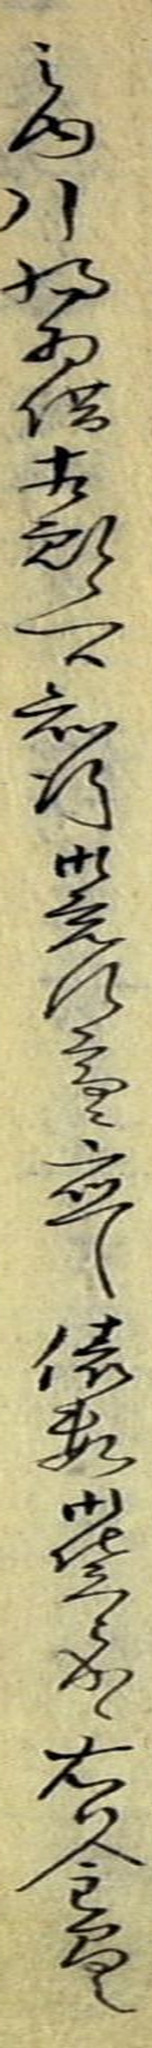之内打引揚拝借相願候へは知行御充行高に応し俵数御貸被成候右は全局之
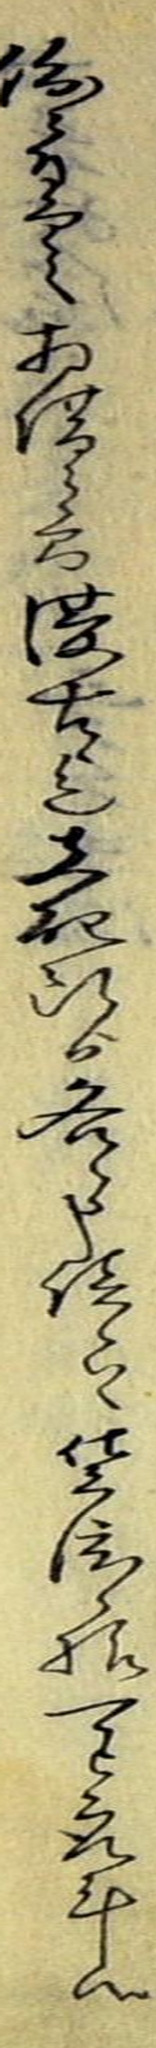儀に付而は拝借候間復古迄支配頭ゟ各へ申談候ハゝ貸渡候様可被取斗候

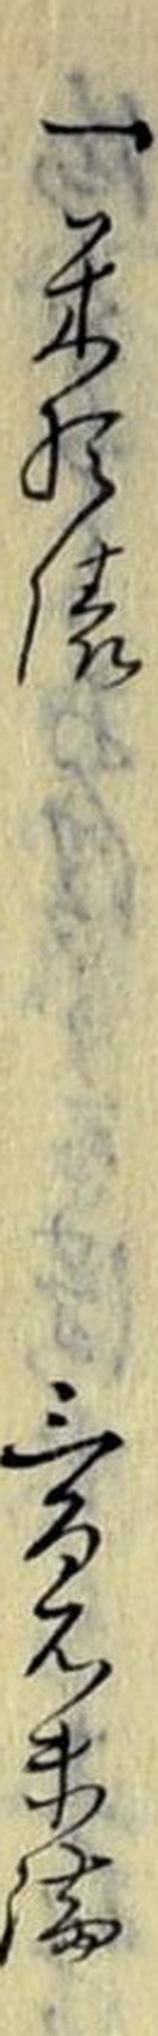一米拾俵三百石未満
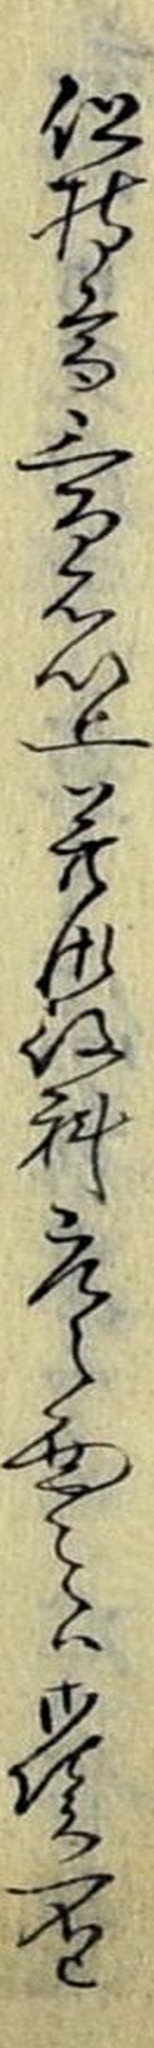但持高三百石以上井御役料取之面々へは御貸不被
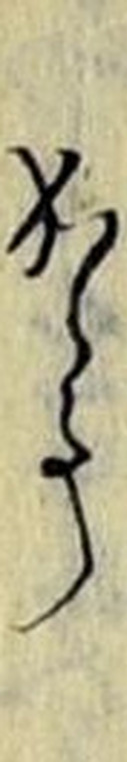成候事
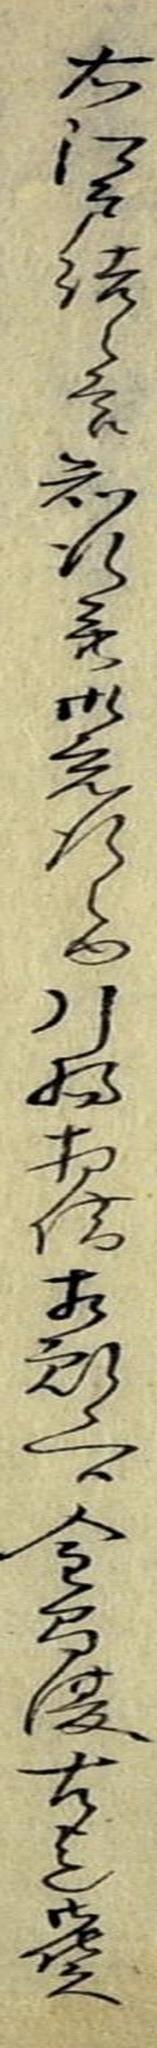右江戸詰之節知行井御充行之内引揚拝借相願候へは全局復古迄御貸
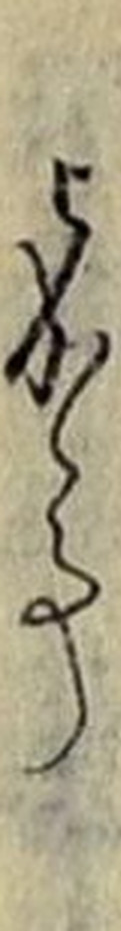被成候事
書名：命令之部 六
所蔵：福井県文書館 Fukui Prefectural Archives
